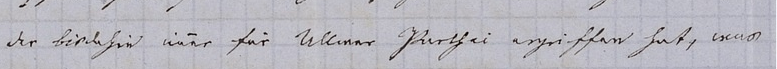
der bis dahin immer für Ullmer Parthei ergriffen hat, was
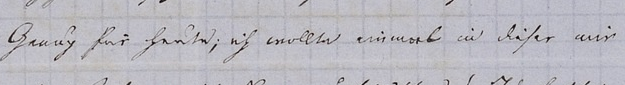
Genug für heute; ich wollte einmal in dieser mir
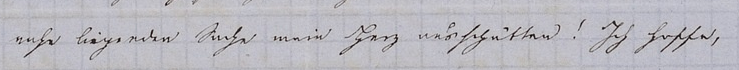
nahe liegenden Sache mein Herz ausschütten! Ich hoffe,
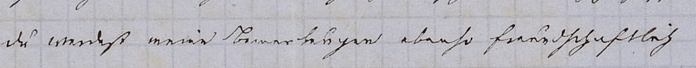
Du werdest meine Bemerkungen ebenso freundschaftlich
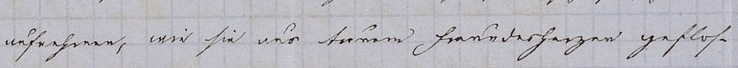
aufnehmen, wie sie aus treuem Freundesherzen geflos-
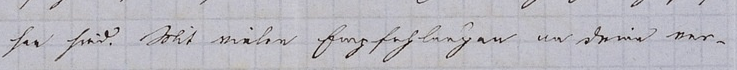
sen sind. Mit vielen Empfehlungen an Deine ver-
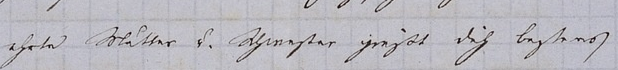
ehrte Mutter u. Schwester grüßt Dich bestens
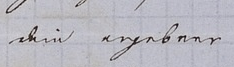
Dein ergebner
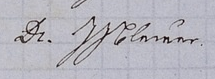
Dr. J J Blumer.
